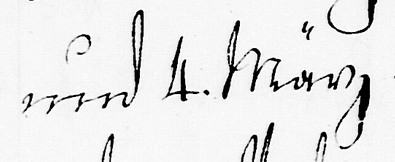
und 4. März.
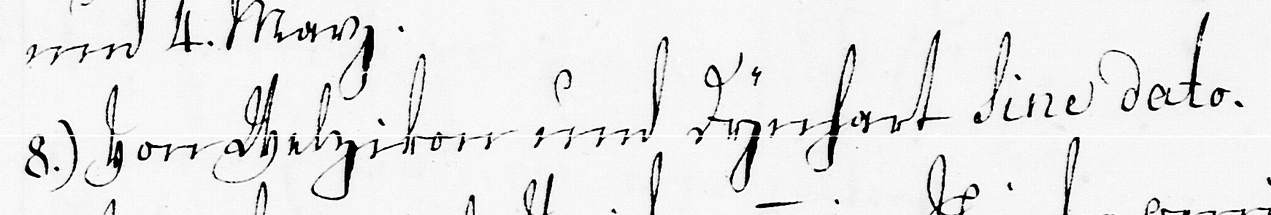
8.) Von Welzikon und Dynhart sine dato.
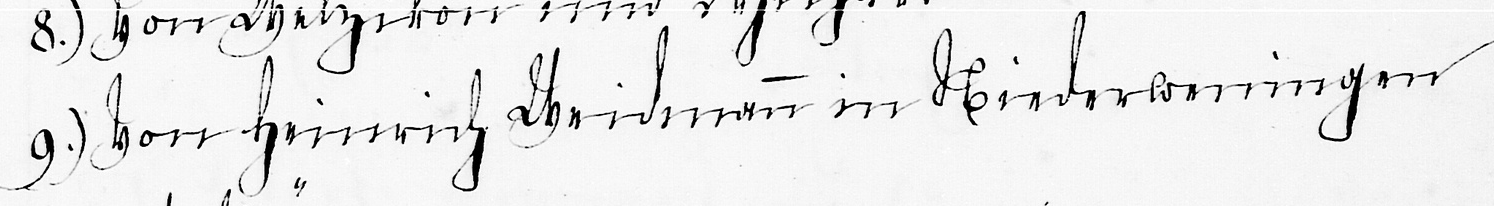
9.) Von Heinrich Weidmann in Niederweningen
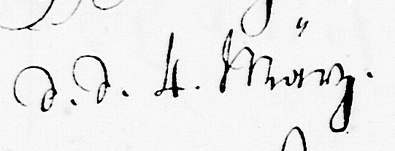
d. d. 4. März.
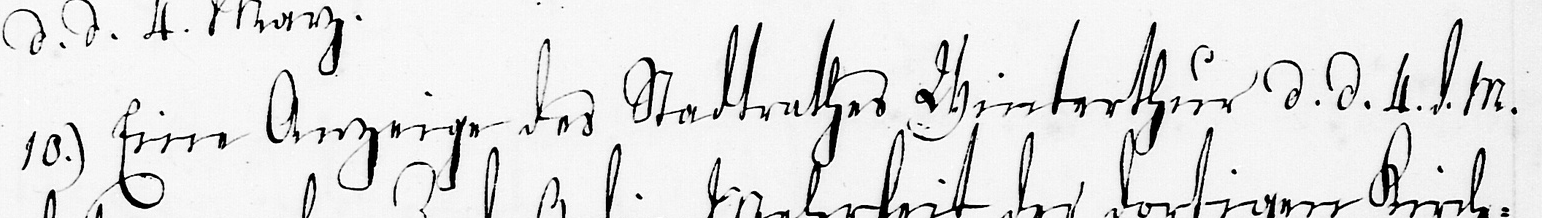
10.) Eine Anzeige des Stadtrathes Winterthur d. d. 4. d. M.
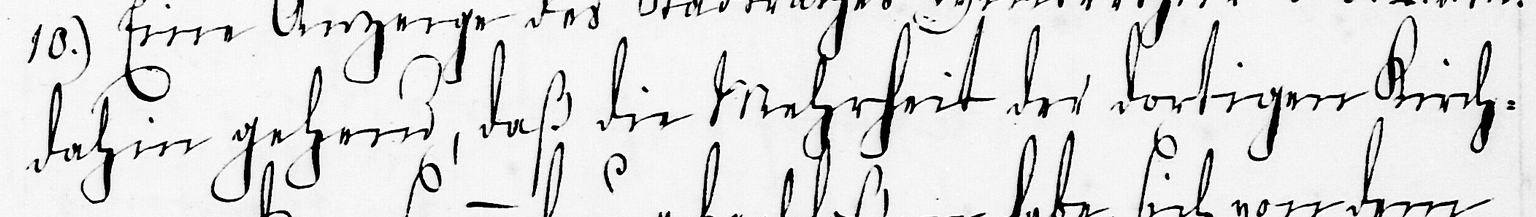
dahin gehend, daß die Mehrheit der dortigen Kirch¬
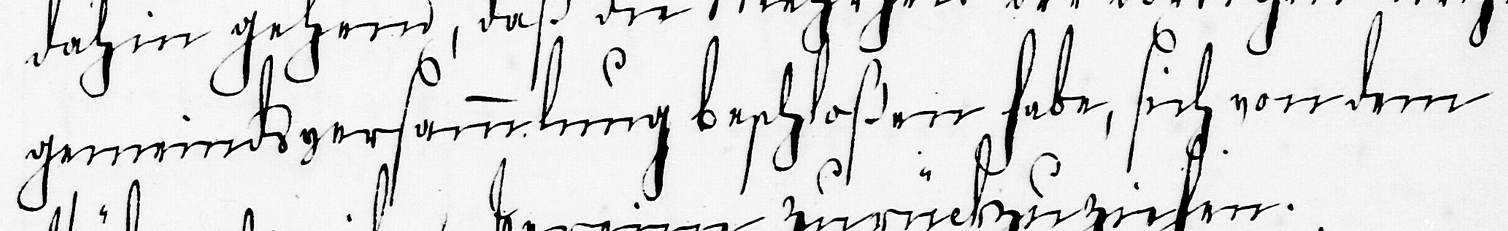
gemeindsversammlung beschloßen habe, sich von dem
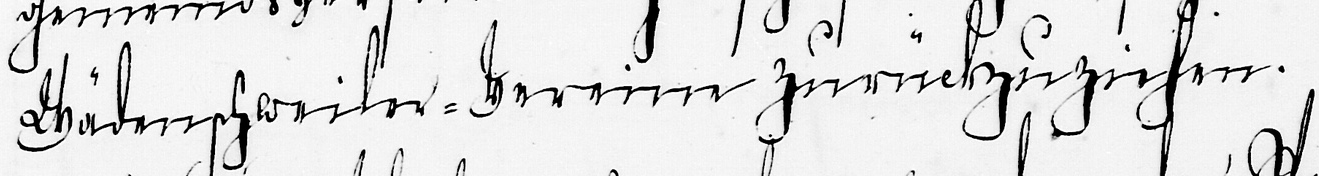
Wädenschweiler-Vereine zurückzuziehen.
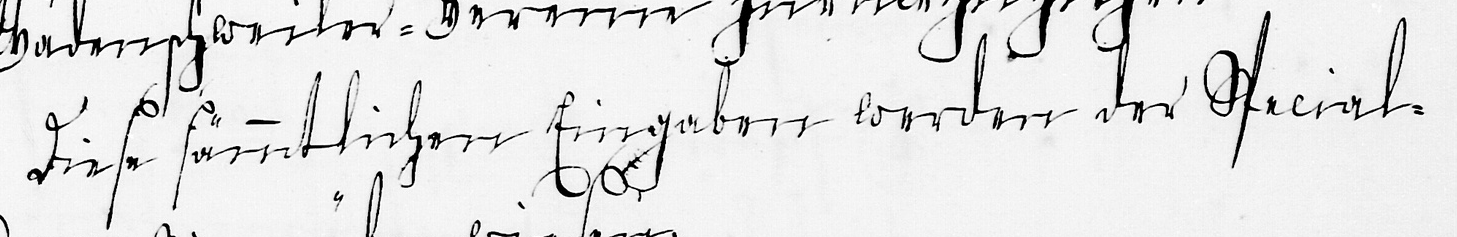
Diese sämmtlichen Eingaben werden der Specia¬
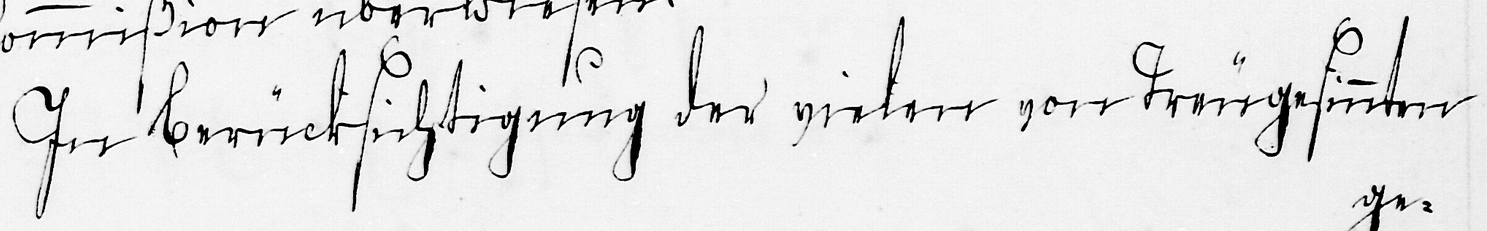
In Berücksichtigung der vielen von Treugesinnten
